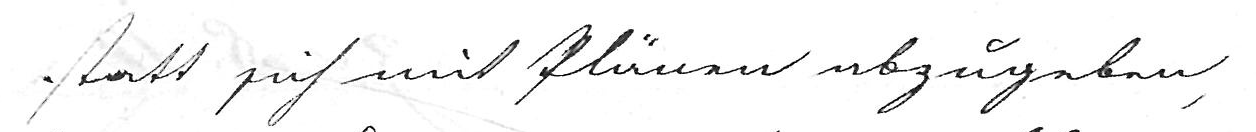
statt sich mit Plänen abzugeben,
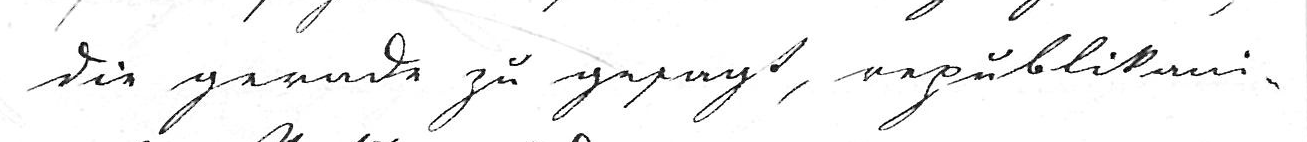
die gerade zu gesagt, republikani-
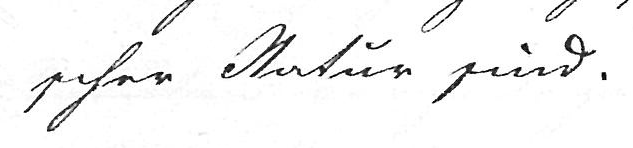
sicher Natur sind.
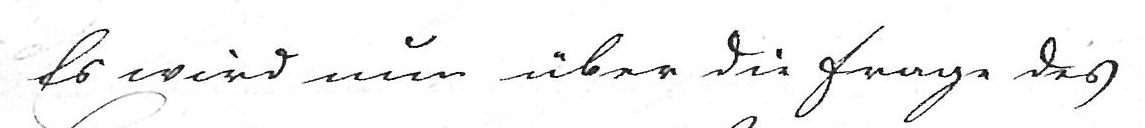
Es wird nun über die Frage des
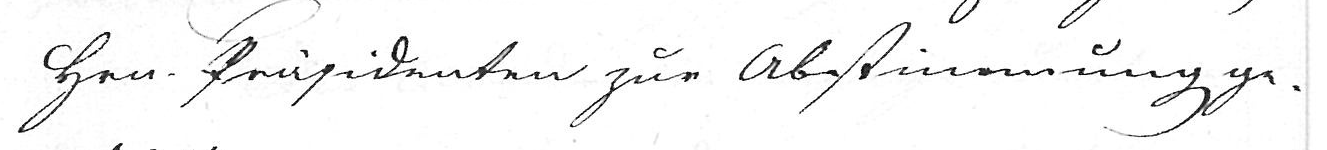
Hrn. Präsidenten zur Abstimmung
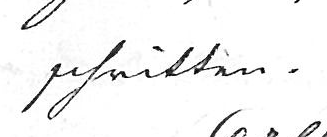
schritten.
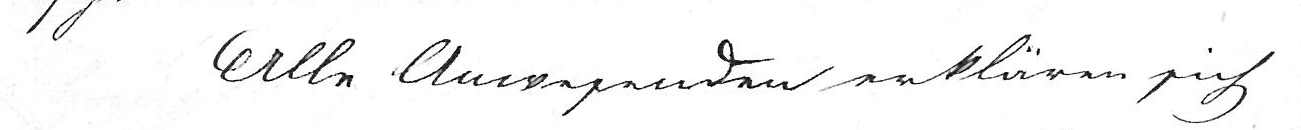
Alle Anwesenden erklären sich
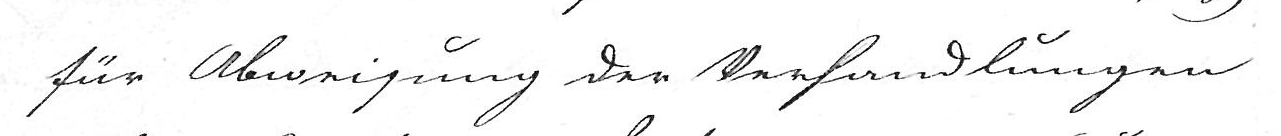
für Abweisung der Verhandlungen
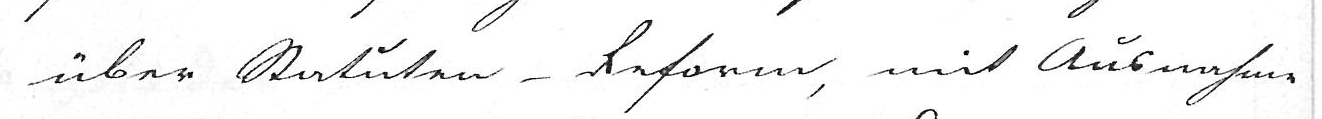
über Statuten-Reform mit Ausnahme
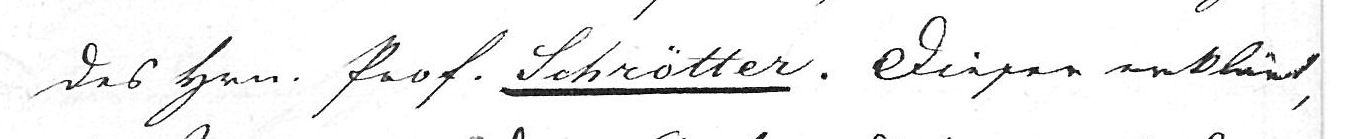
des Hrn. Prof. Schrötter. Dieser erklärt,
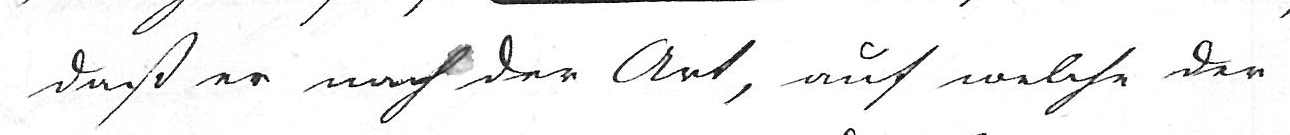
daß er nach der Art, auf welche der
